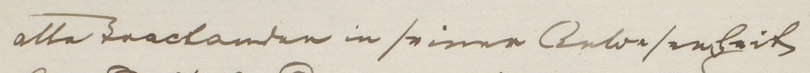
alle Tractanden in seiner Anwesenheit
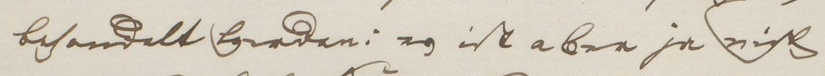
behandelt werden: es ist aber ja nicht
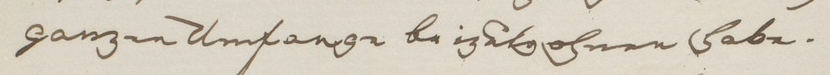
ganzen Umfange beizuwohnen habe.
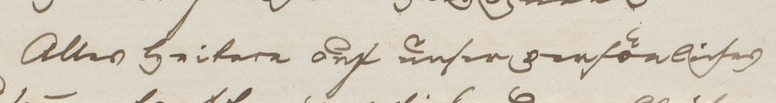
Alles weitere auf unser persönliches
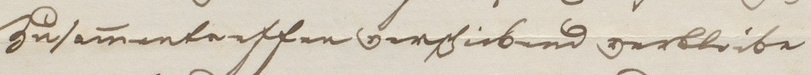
Zusammentreffen verschiebend verbleibe
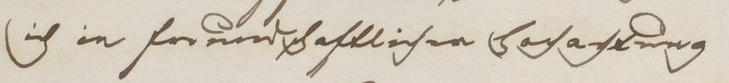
ich in freundschaftlicher Hochachtung
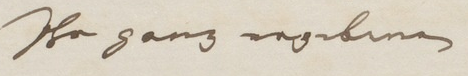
Ihr ganz ergebene
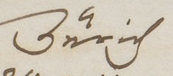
Zürich
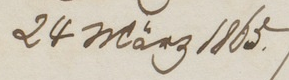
24 März 1865.
